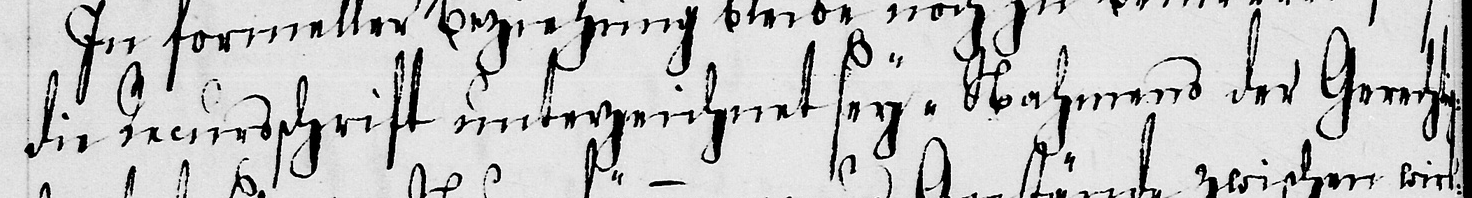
die Recursschrift unterzeichnet sey. „Nahmens der Gerech¬
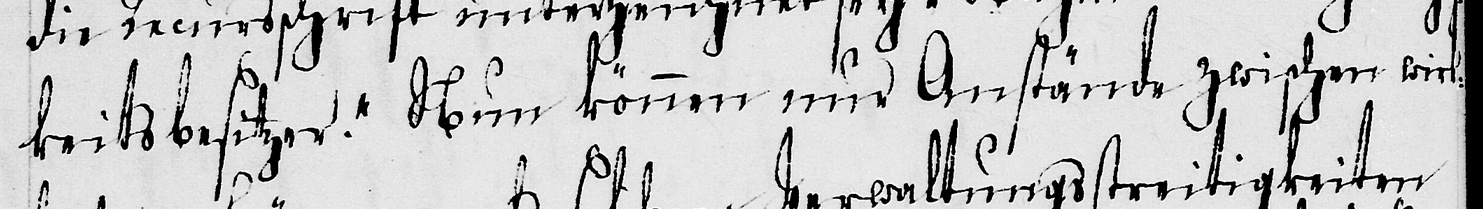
keitsbesitzer.“ Nun können nur Anstände zwischen wirk¬
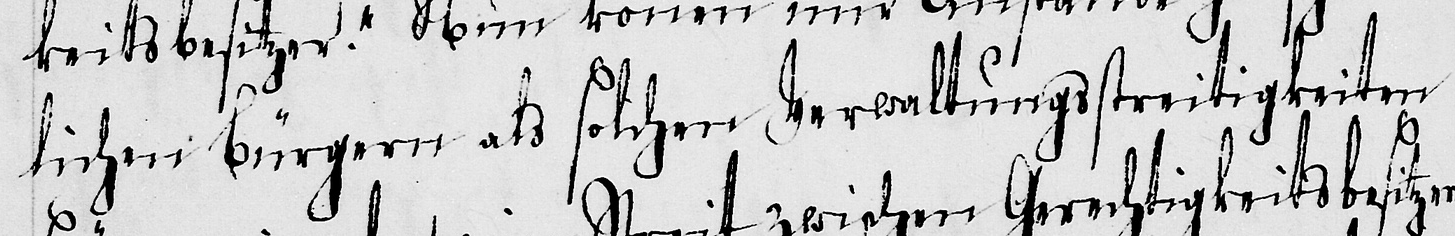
lichen Bürgern als solchen Verwaltungsstreitigkeiten
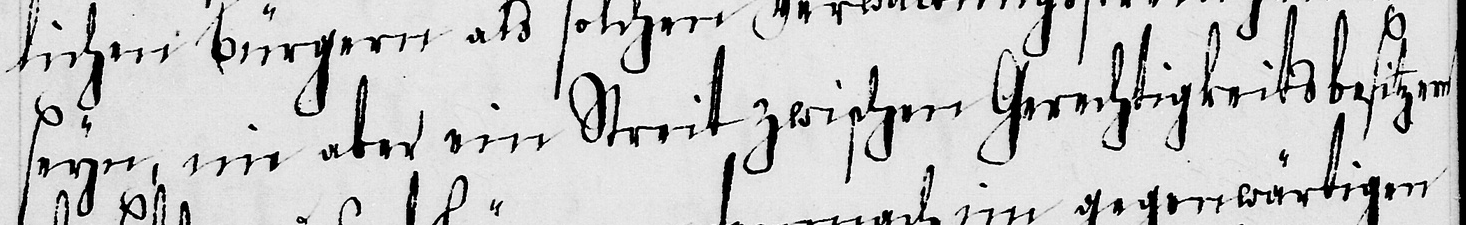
seyn, nie aber ein Streit zwischen Gerechtigkeitsbesitze¬
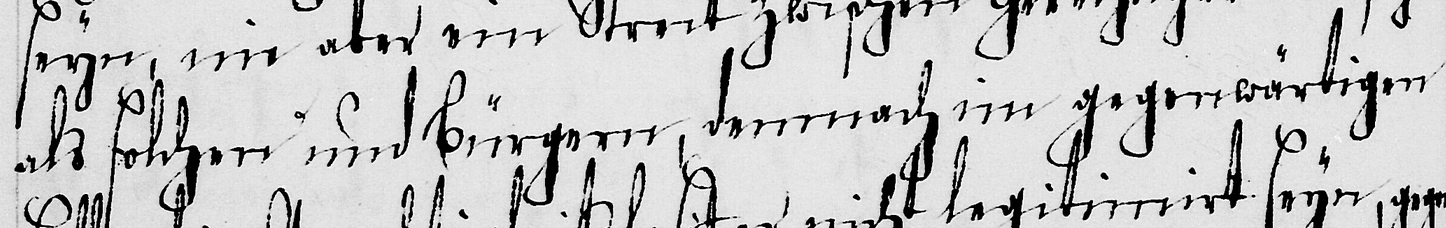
als solchen und Bürgern, demnach im gegenwärtigen
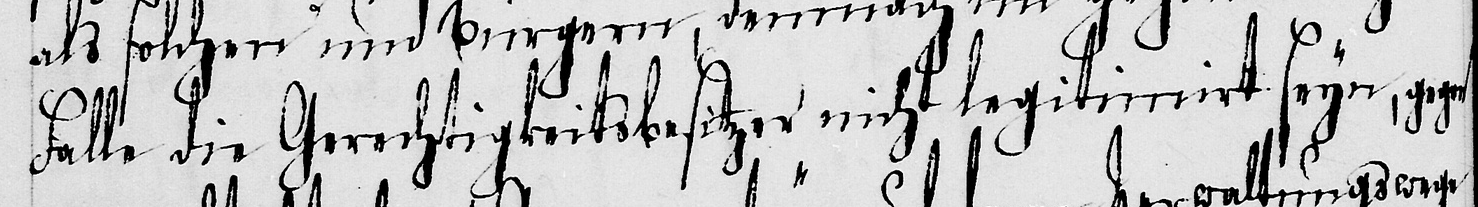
Falle die Gerechtigkeitsbesitzer nicht legitimirt seyn, geg¬
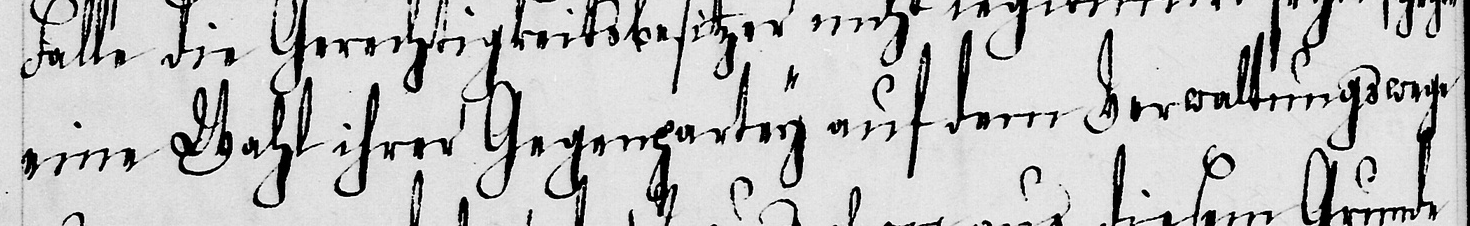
eine Wahl ihrer Gegenpartey auf dem Verwaltungswege
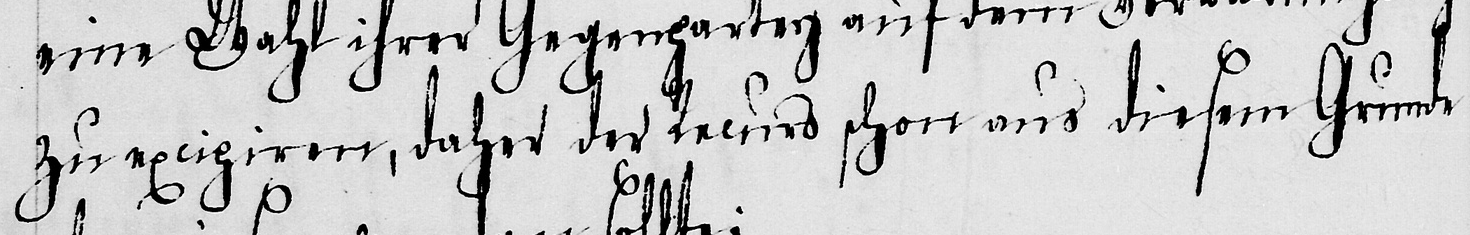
zu excipiren, daher der Recurs schon aus diesem Grunde
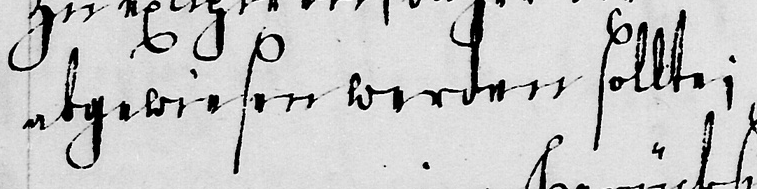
abgewiesen werden sollte;
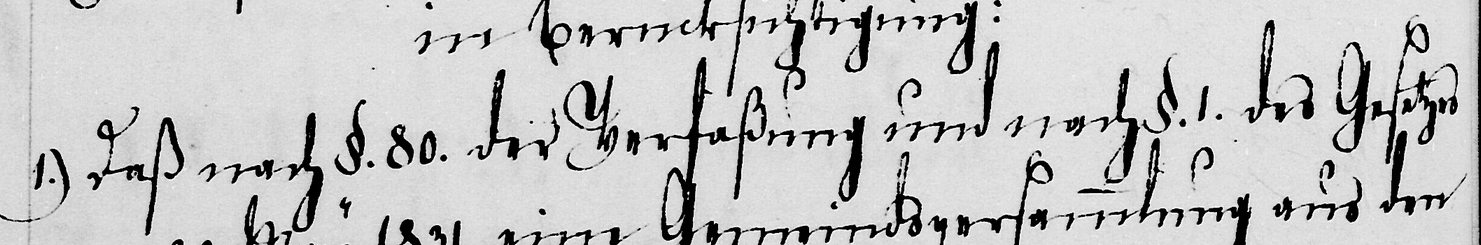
1.) Daß nach §. 80. der Verfaßung und nach §. 1. des Gesetz¬
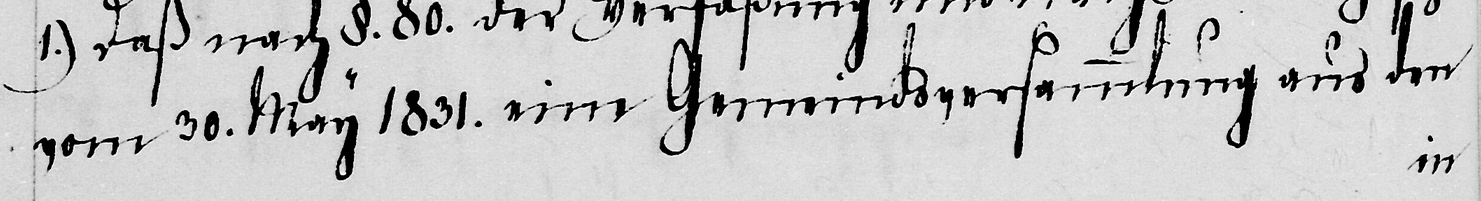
vom 30. May 1831. eine Gemeindsversammlung aus den
